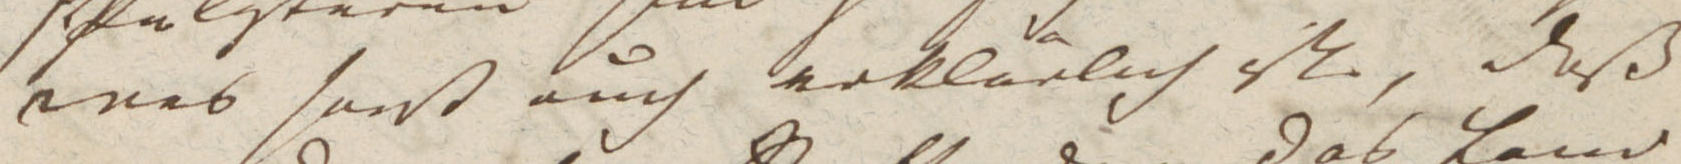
was sonst auch erklärlich ist, dass
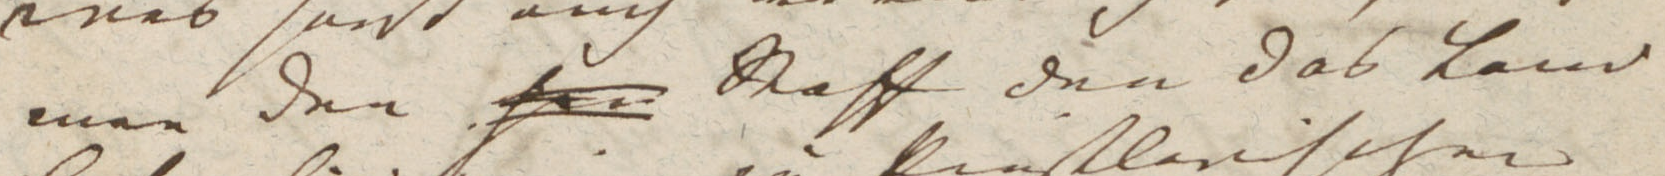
man den her Stoff den das Land
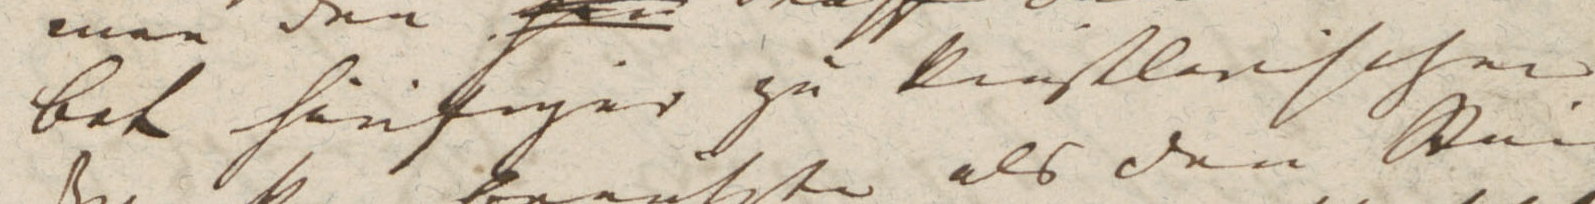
bot häufiger zu künstlerischen
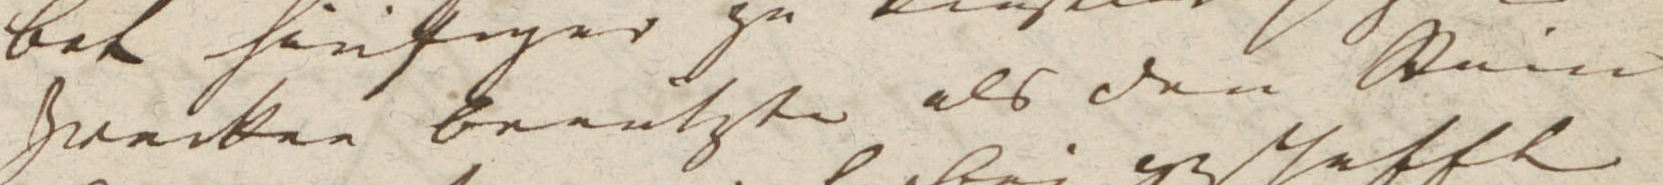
Zwecken benützte als den Stein
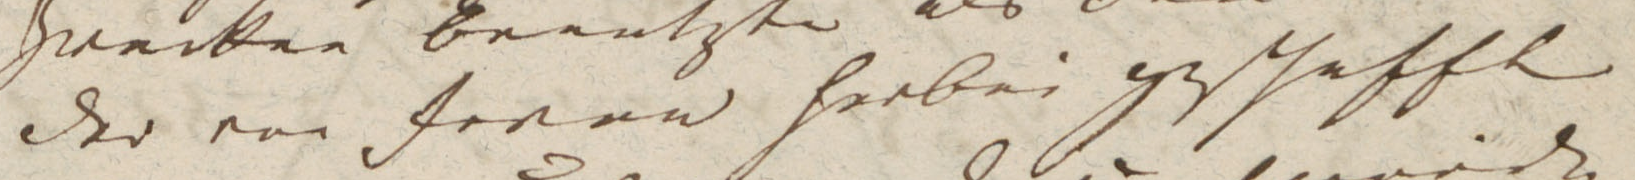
der von Fernen herbei geschafft
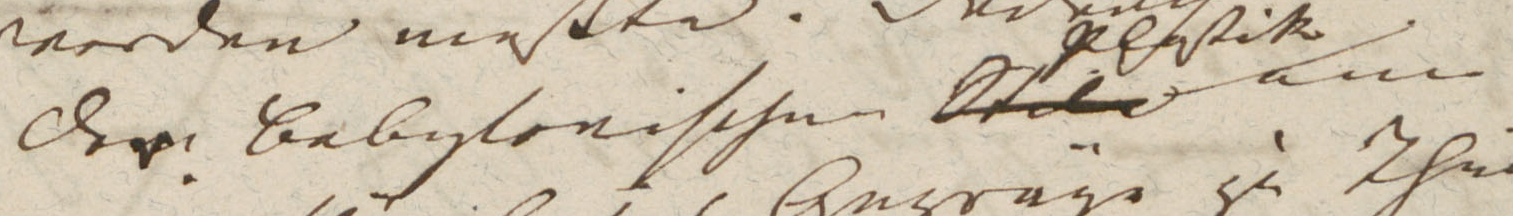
demr Babylonischen Stile Plastik ein
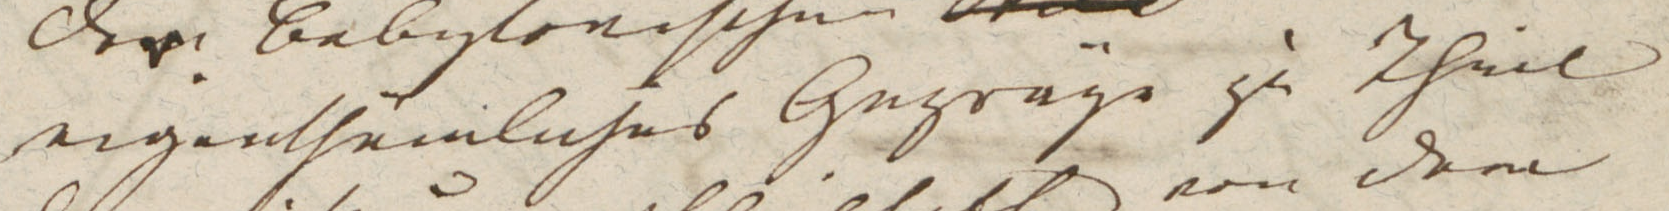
eigenthümliches Gepräge zu Theil
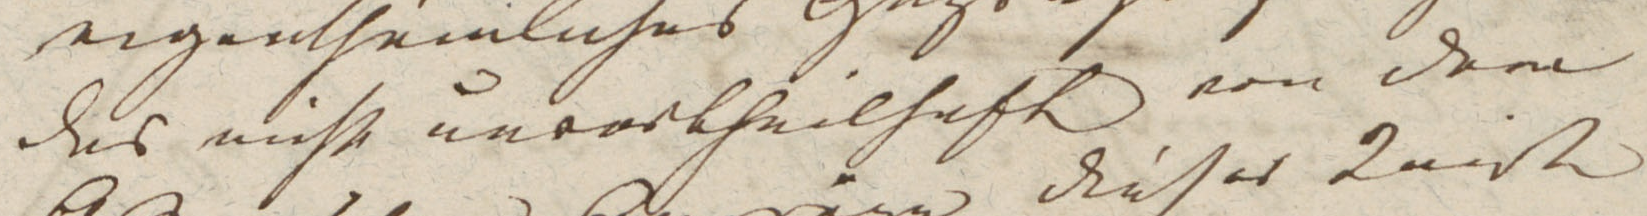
das nicht unvortheilhaft von dem
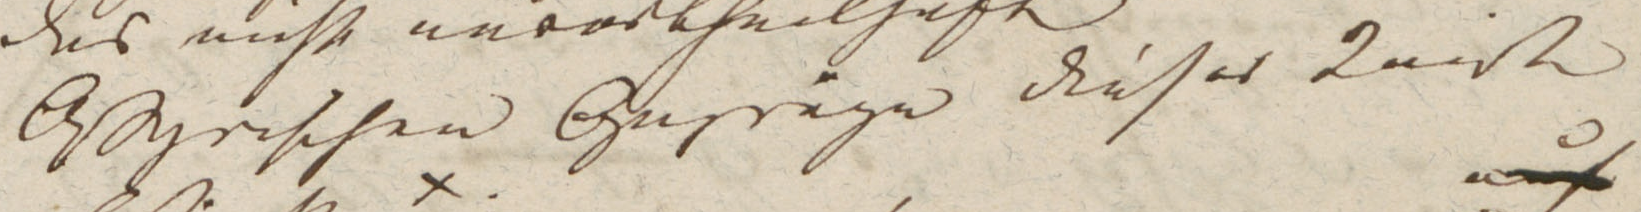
Assyrischen Gepräge dieser Kunst
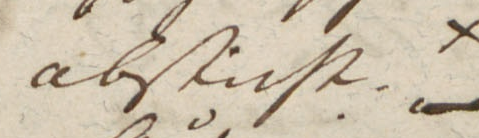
absticht. %
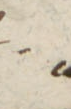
%
